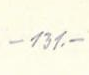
131
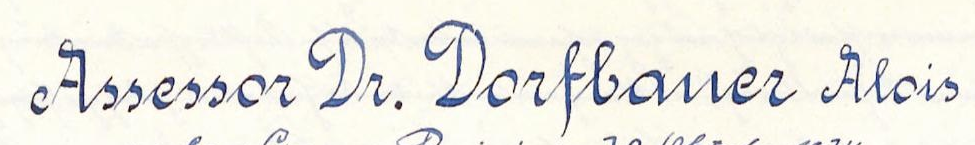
Assessor Dr. Dorfbauer Alois
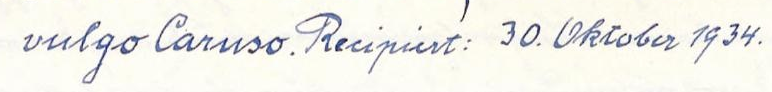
vulgo Caruso. Recipiert: 30. Oktober 1934.
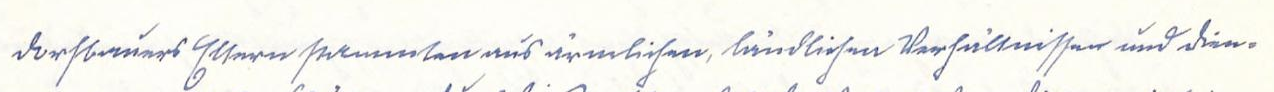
Dofbauers Eltern stammten aus ärmlichen, ländlichen Verhältnissen und dien-
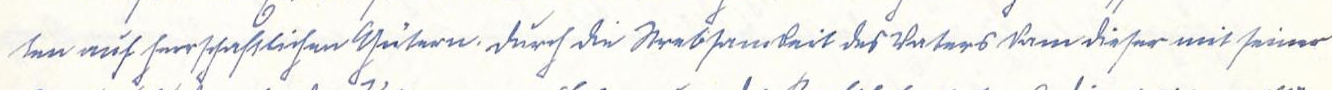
ten auf herrschaftlichen Gütern. Durch die Strebsamkeit des Vaters kam dieser mit seiner
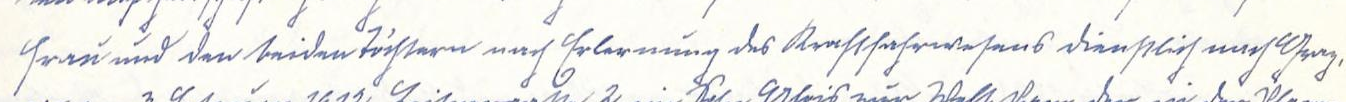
Frau und den beiden Töchtern nach Erlernung des Kraftfahrwesens dienstlich nach Graz,
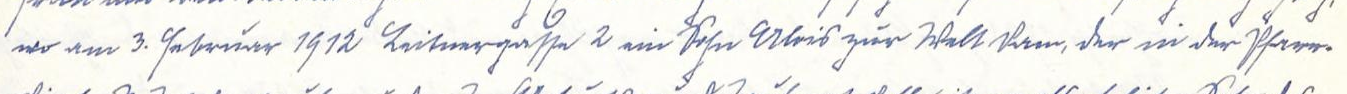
wo am 3. Februar 1912 Leitnergasse 2 ein Sohn Alois zur Welt kam, der in der Pfarr-
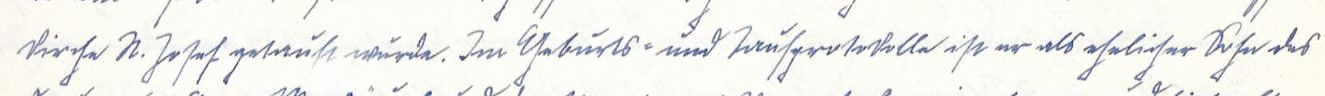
kirche St. Josef getauft wurde. Im Geburts- und Taufprotokolle ist er als ehelicher Sohn des
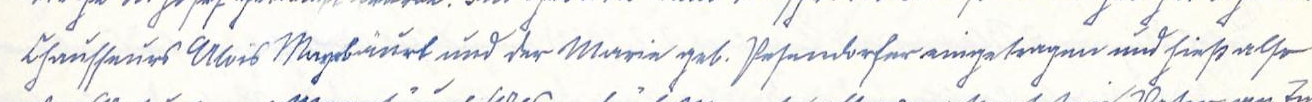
Chauffeurs Alois Mayrbäurl und der Maria geb. Pesendorfer eingetragen und hieß also
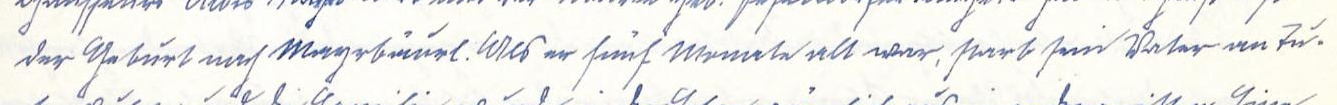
der Geburt nach Mayrbäurl. Als er fünf Monaten alt war, starb sein Vater an Tu-
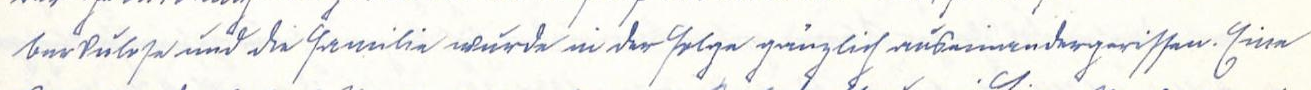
berkulose und die Familie wurde in der Folge gänzlich auseinandergerissen. Eine
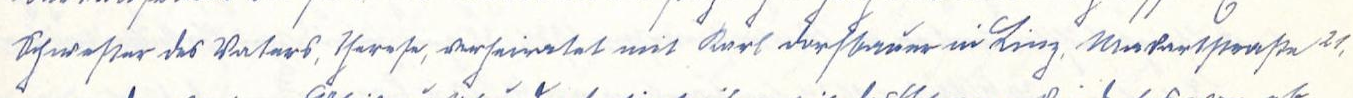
Schwester des Vaters, Therese, verheiratet mit Karl Dorfbauer in Linz, Markartstraße 2,
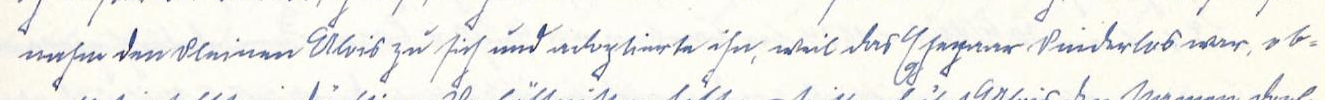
nahm den kleinen Alois zu sich und adoptierte ihn, weil das Ehegaar kinderlos war, ob-
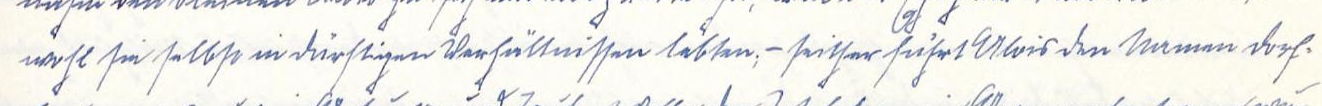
wohl sie selbst in dürftigen Verhältnissen liebsten, - seither führt Alois den Namen Dorf-
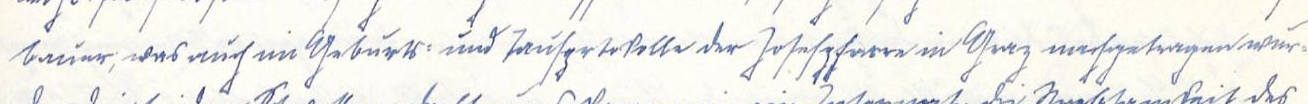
bauer, was auch in Geburts- und Taufprotokolle der Josefpfarre in Graz nachgetragen wur-
